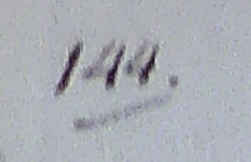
144.
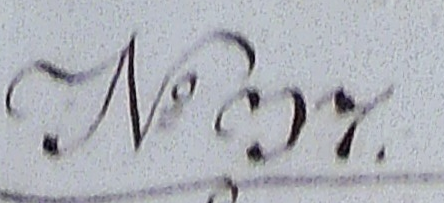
No͇ 37.
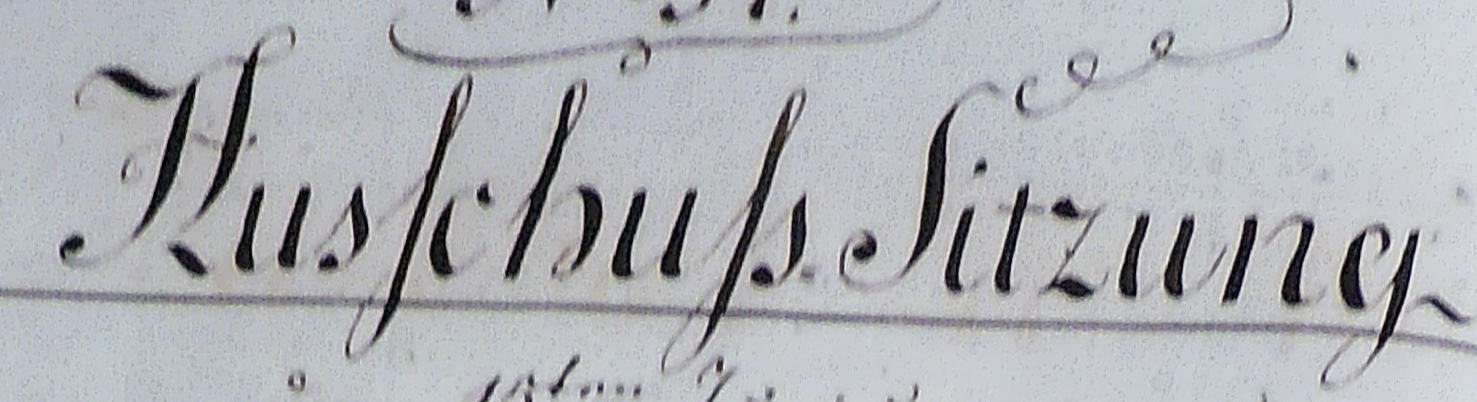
Ausschuss‗Sitzung
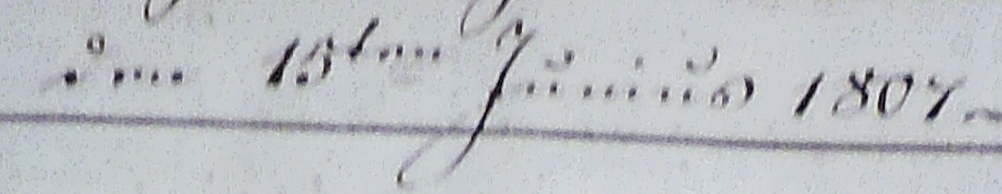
den 15te͇n Junius 1807.
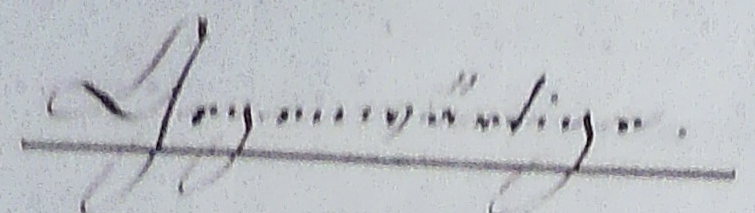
Gegenwärtige.
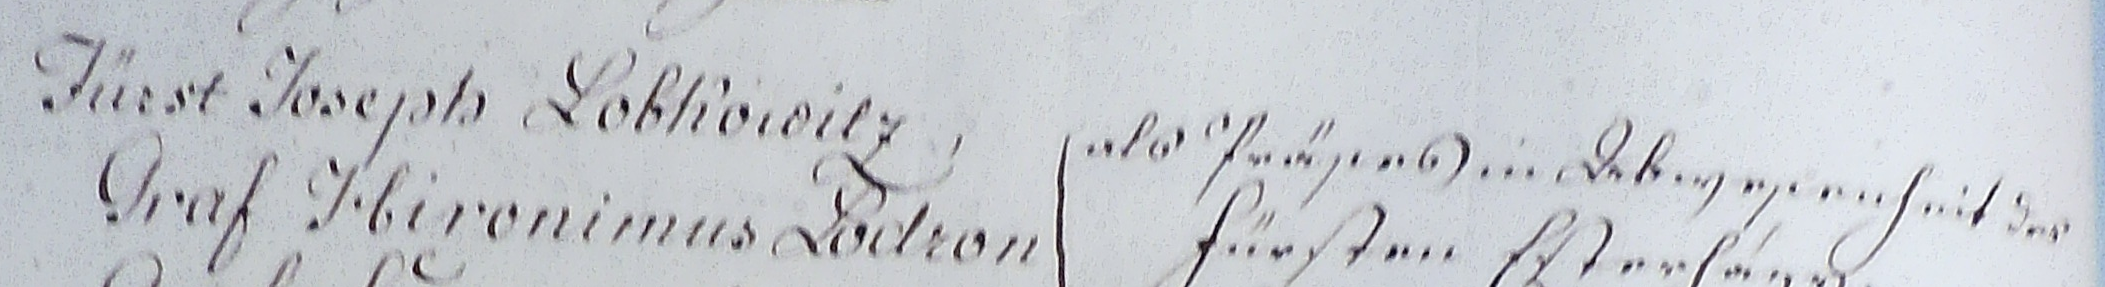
Fürst Joseph Lobkowitz, als Präses, in Abwesenheit des
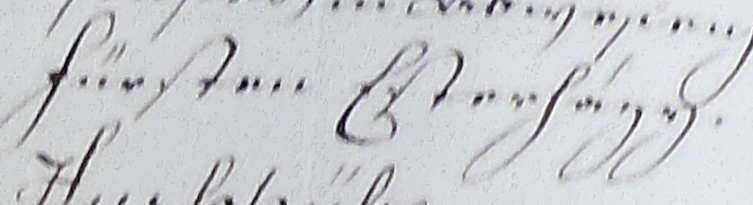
Fürsten Esterházy.
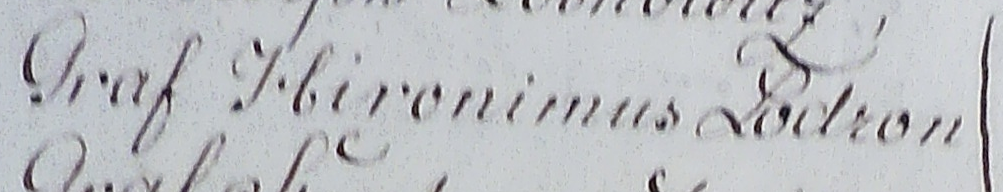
Graf Hironimus Lodron
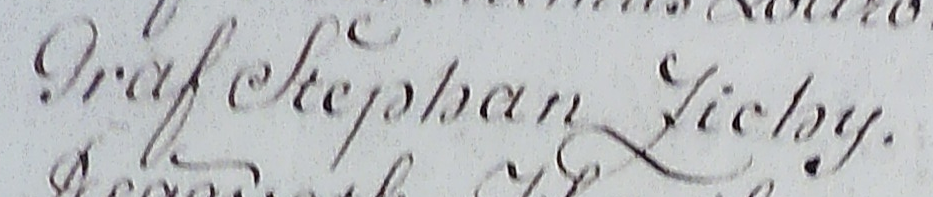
Graf Stephan Zichy.
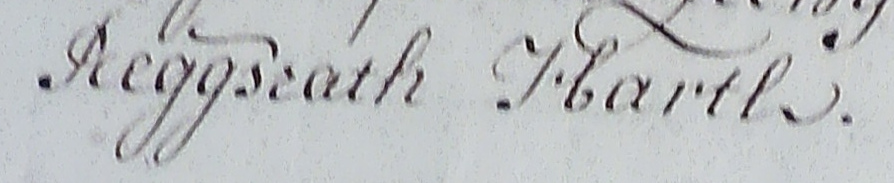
Reg͞gsrath Hartl.
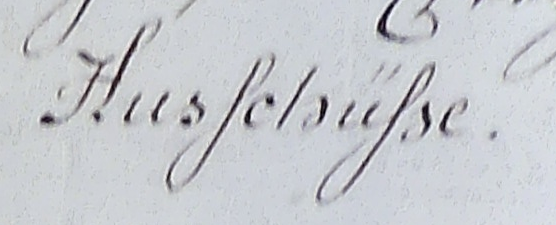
Ausschüsse
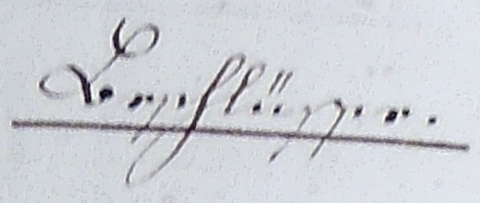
Beschlüsse.
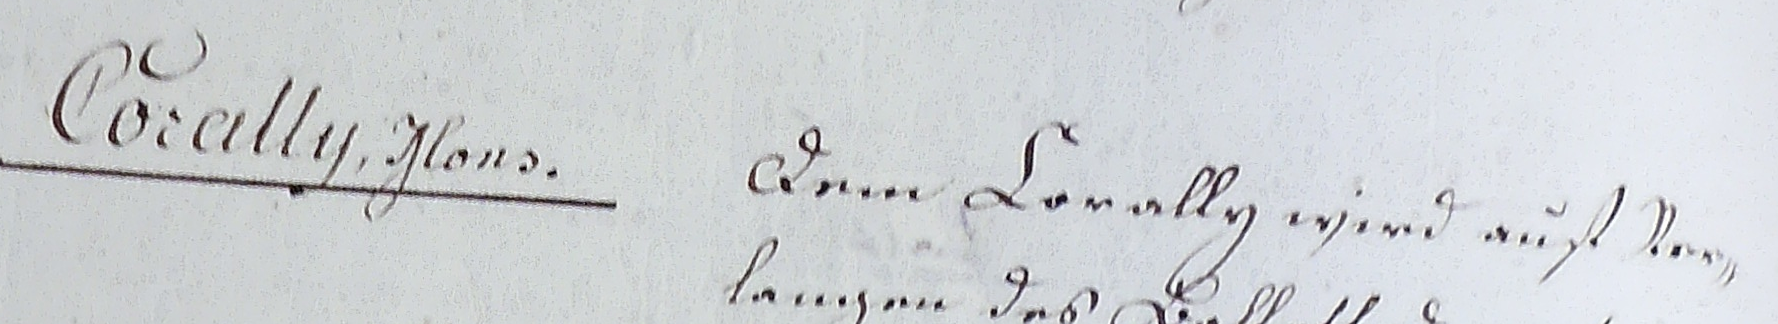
Corally, Mons. Dem Corally wird auf Ver¬
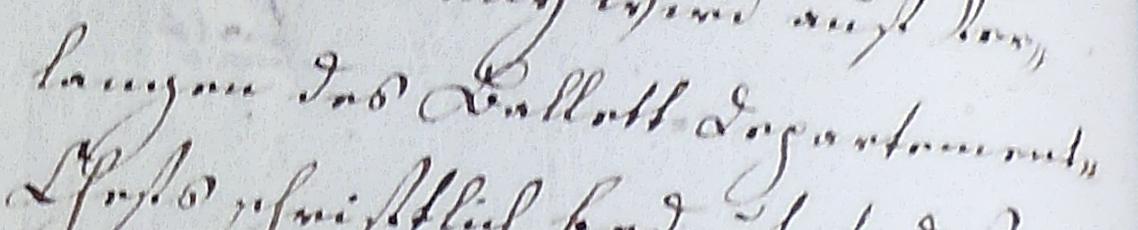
langen des Ballett Departement¬
